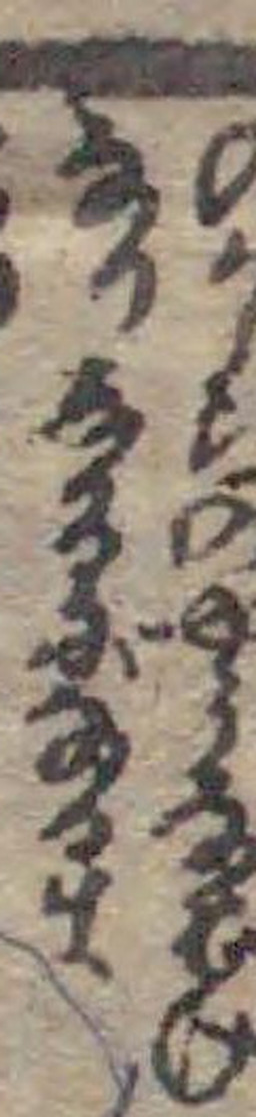なりしかるになかま
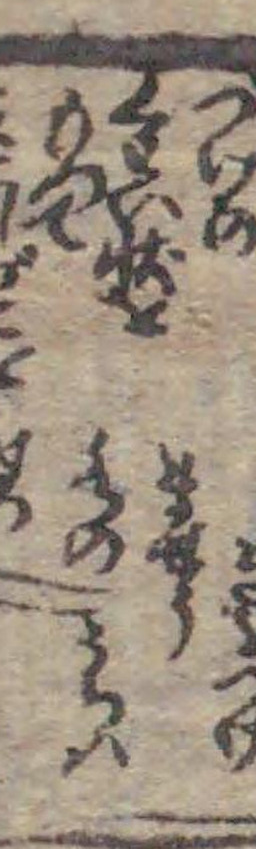もつて
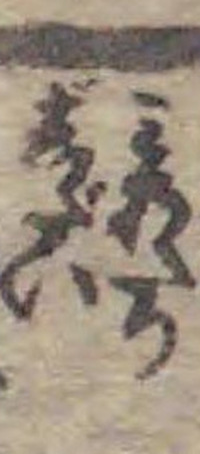しだい
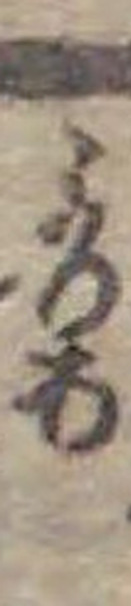よりあ
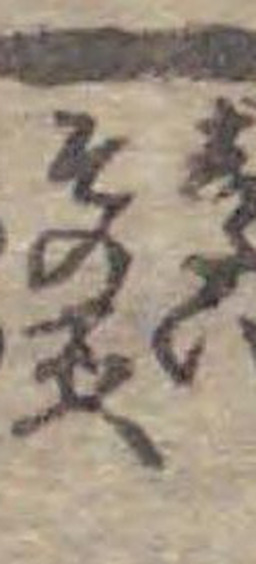その子へ
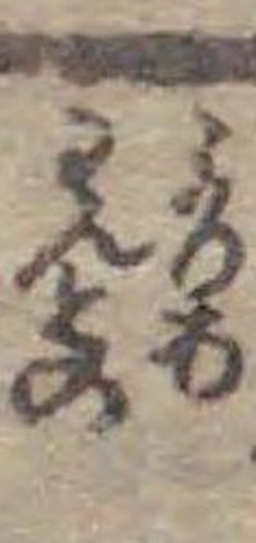わんとの
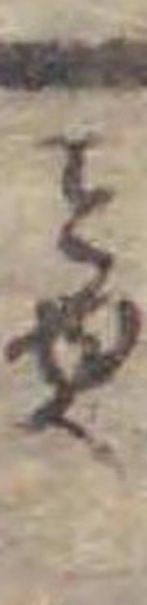ことゆへ
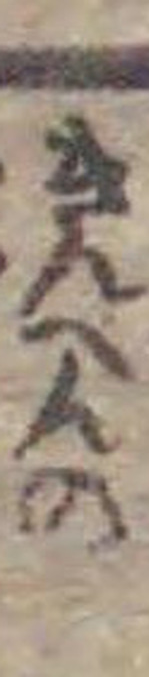きんへんの
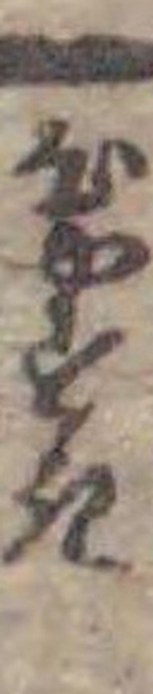心やすき
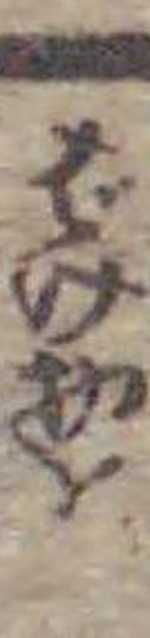ばけ物を
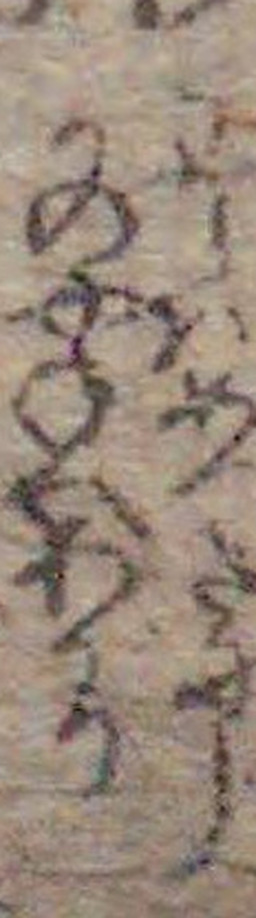かのやねへあかり
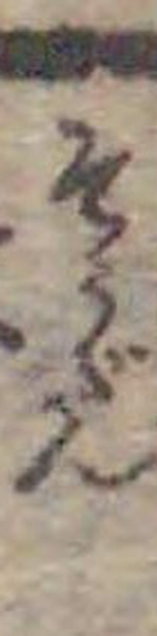そうだん
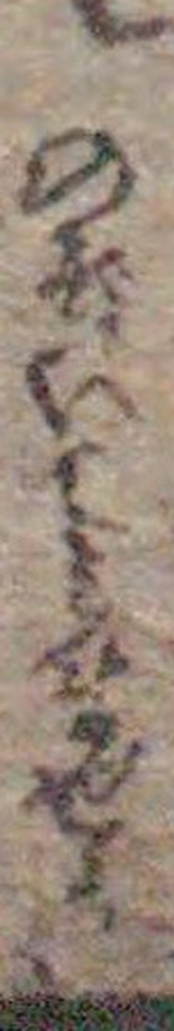のそいてみませう
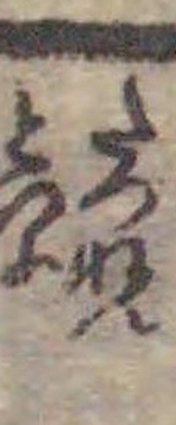といふ
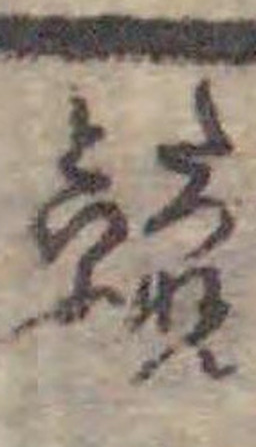といふ
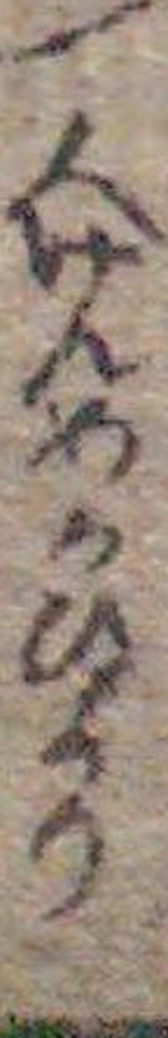人けんめかひより
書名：[化物一代記] : 5巻
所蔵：国立国会図書館 National Diet Library, JAPAN
